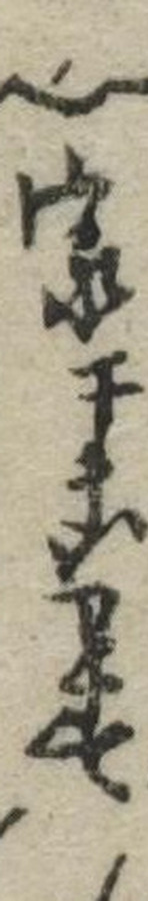家ヲこわす
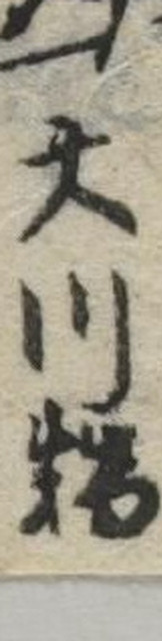大川橋
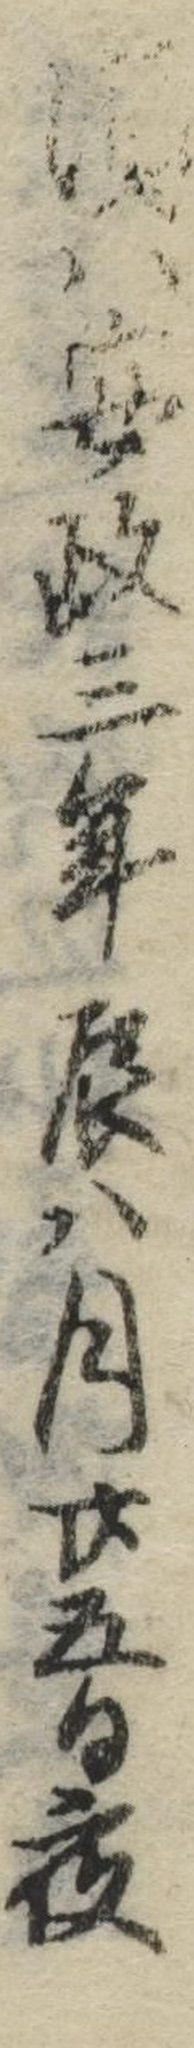頃ハ安政三年辰八月廿五日夜
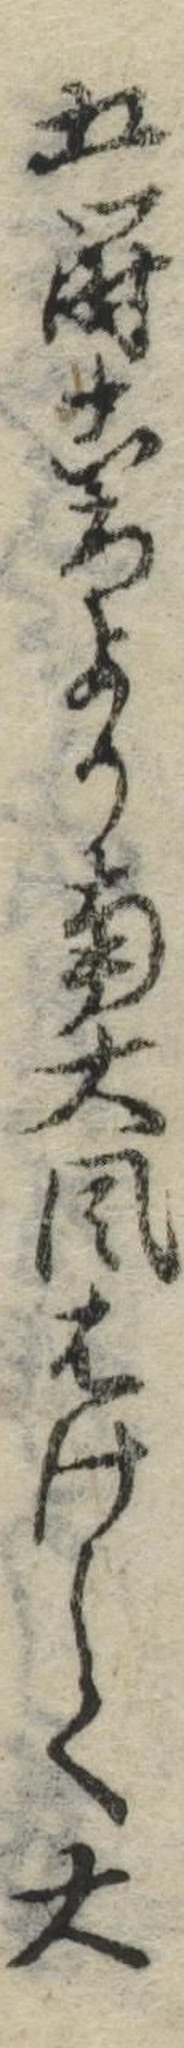五ツ時ころより南大風はけしく大

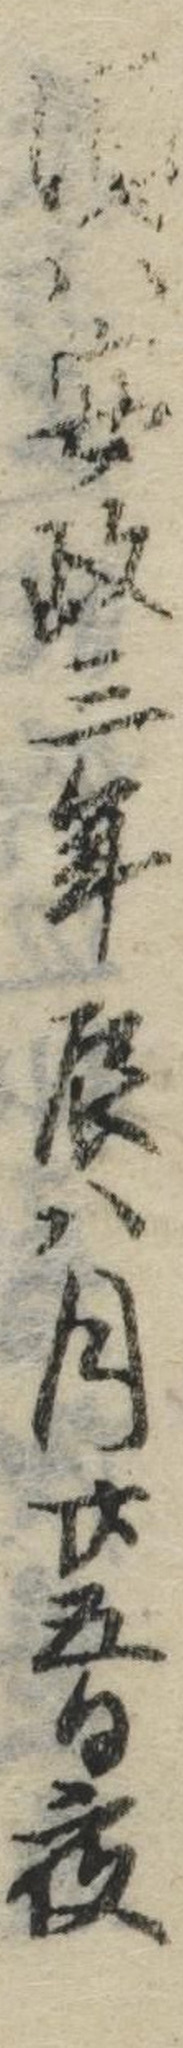頃は安政三年辰八月廿五日夜
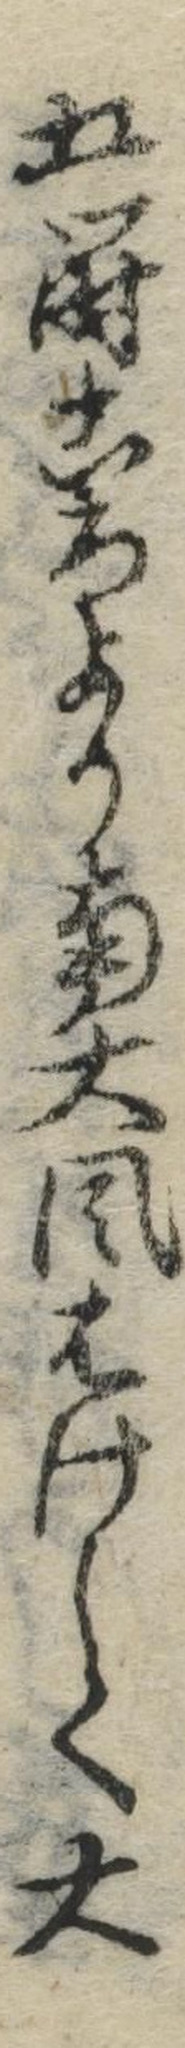五ツ時ころより南大風はけしく大
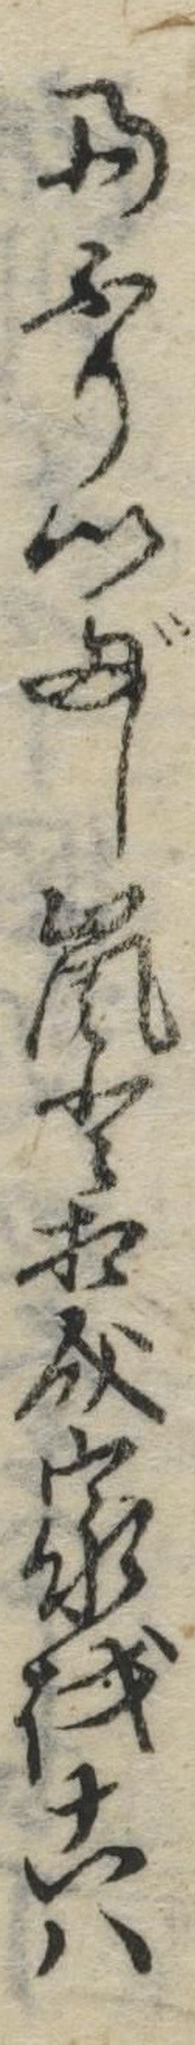雨ふりいだし嵐と相成家をこは
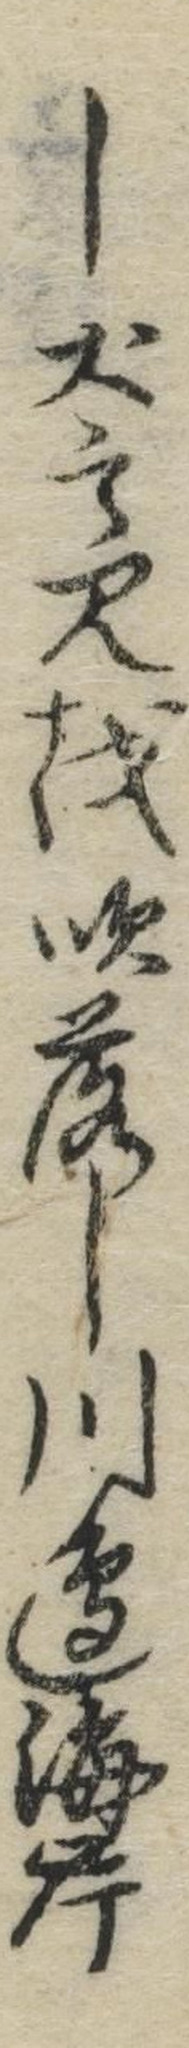し火之見を吹落し川辺海岸
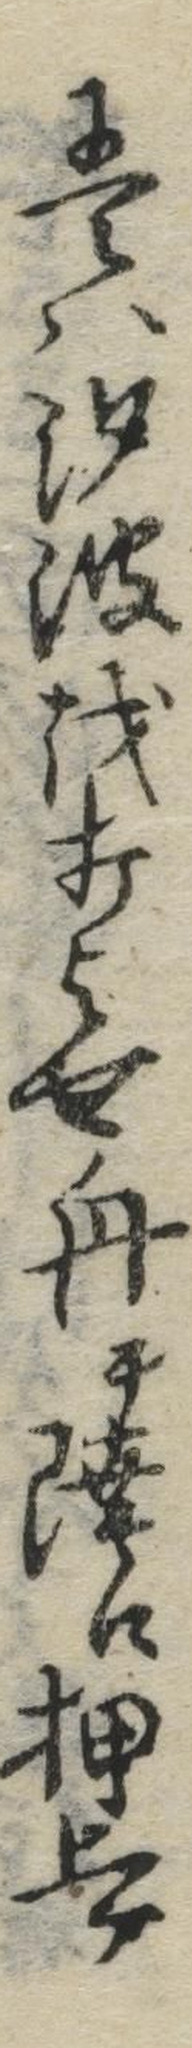にては汐波を打よせ舟を陸へ押上け
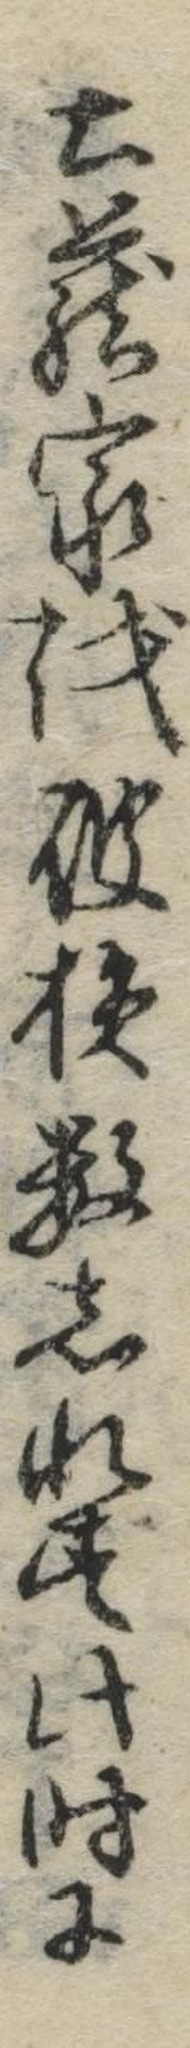土蔵家を破損数しれす此時に
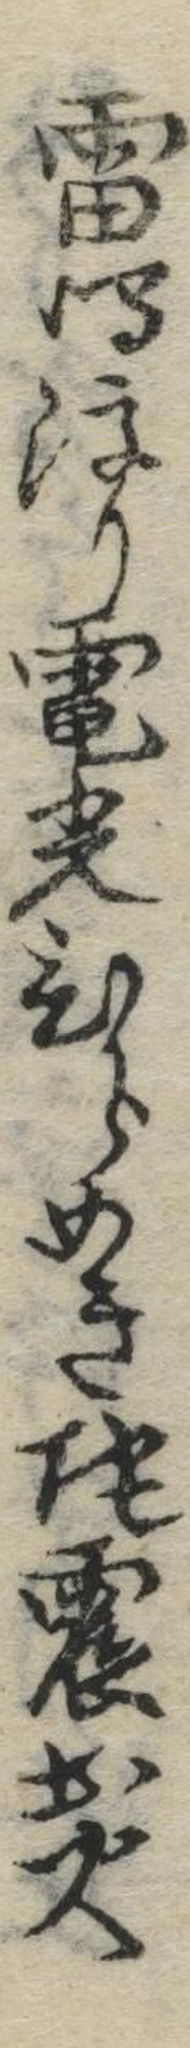雷鳴渡り電光ひらめき地震出火
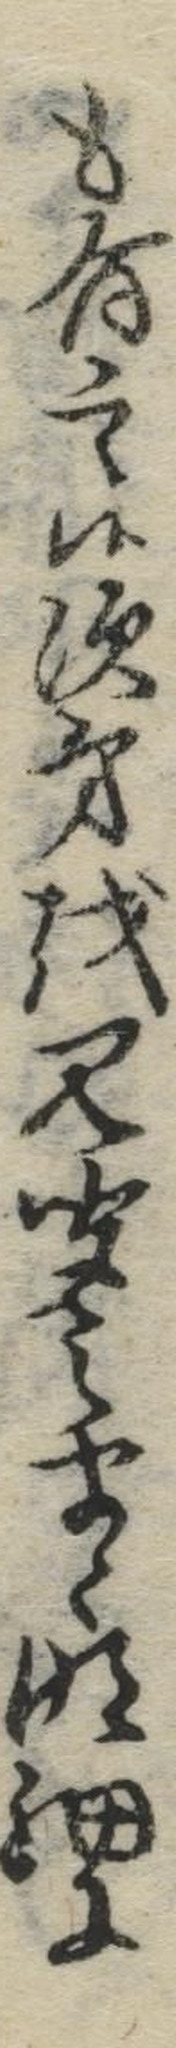も有之候次第を見聞しまゝ明細に
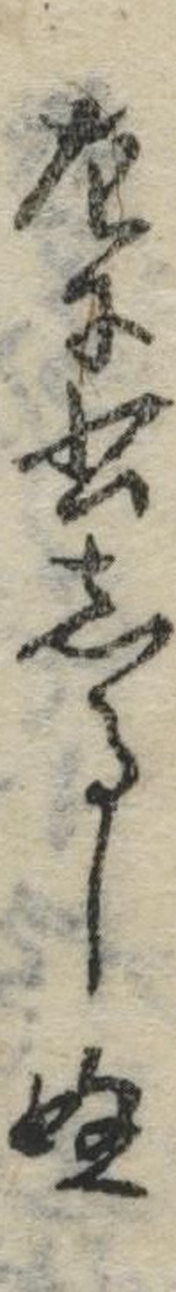左に書しるしぬ
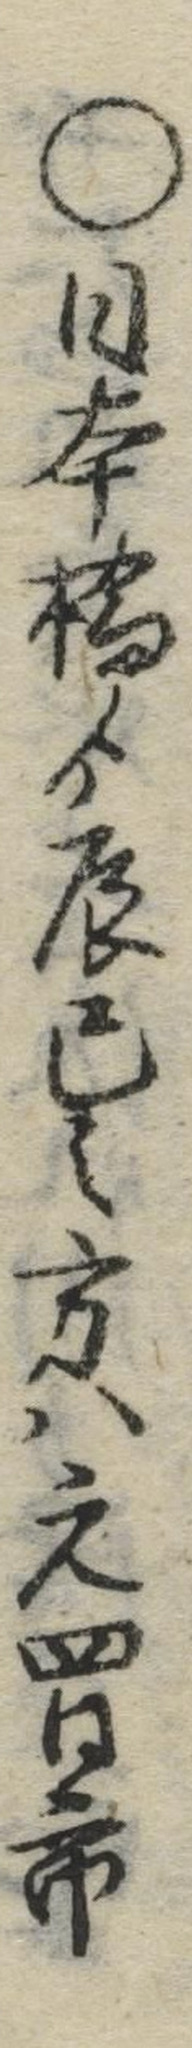○日本橋ゟ辰巳之方は元四日市
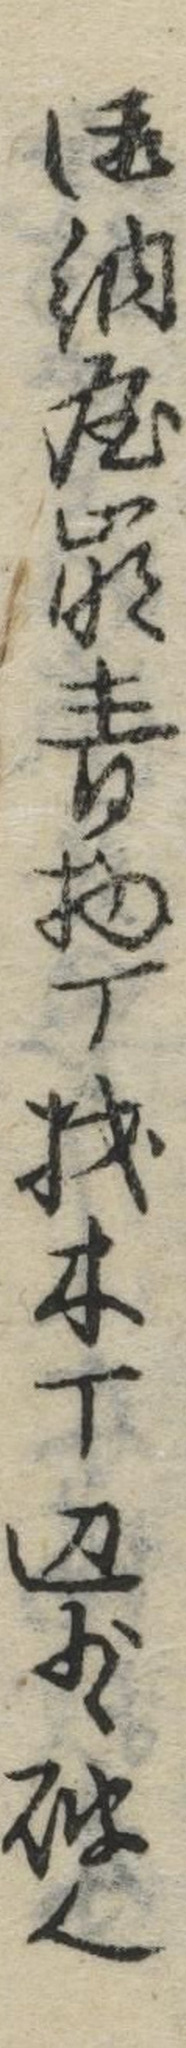御納屋崩青物丁材木丁辺少〻破也
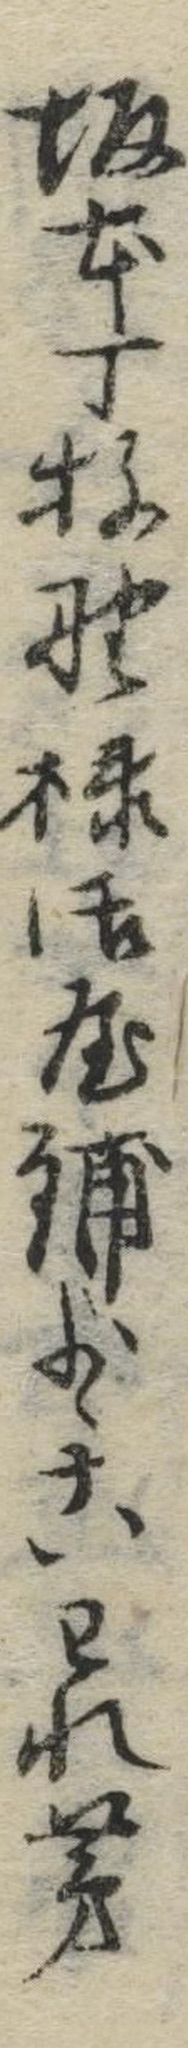坂本丁牧野様御屋鋪少〻こわれ茅
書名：安政三年辰八月廿五日夜　大江都御屋敷方寺社市中共　大嵐水入場所明細書之寫　并街道筋近郷聞書
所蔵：東京大学地震研究所図書室 Earthquake Research Institute Library, The University of Tokyo, JAPAN
